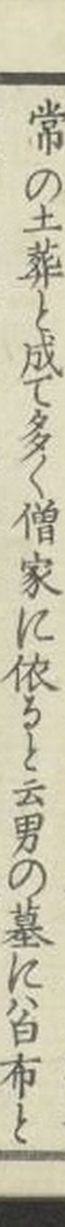常の土葬と成て多く僧家に依ると云男の墓には白布と
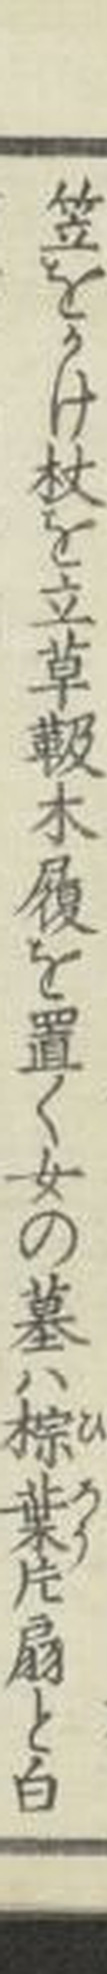笠をかけ杖を立草靸木履を置く女の墓は棕葉片扇と白
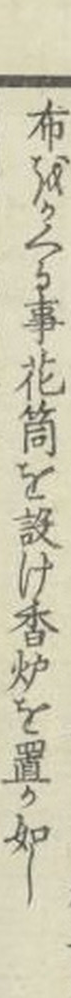布をかくる事花筒を設け香炉を置か如し

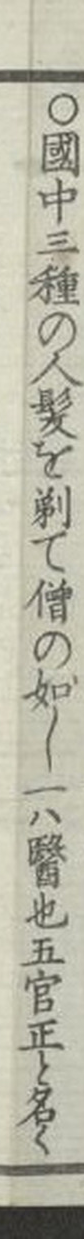○国中三種の人髪を剃て僧の如し一は医也五官正と名く
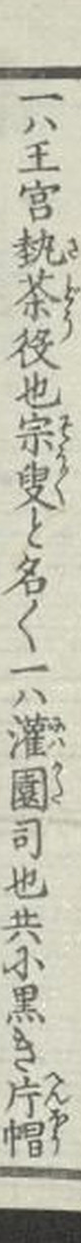一は王宮埶茶役也宗叟と名く一は灌園司也共に黒き片帽
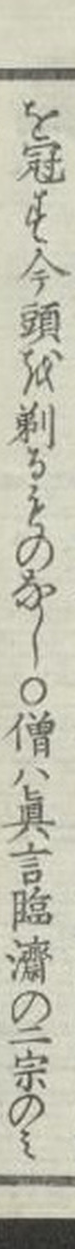を冠す今頭を剃るものなし○僧は真言臨済の二宗のみ
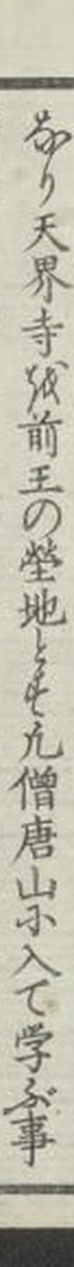なり天界寺を前王の塋地とす凡僧唐山に入て学ぶ事
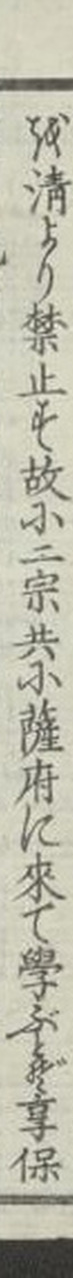を清より禁止す故に二宗共に薩府に来て学ぶとぞ享保
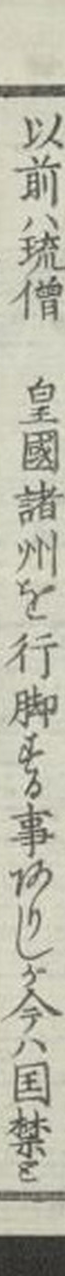以前は琉僧皇国諸州を行脚する事ありしが今は国禁と
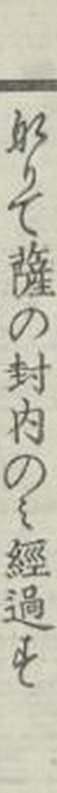なりて薩の封内のみ経過す
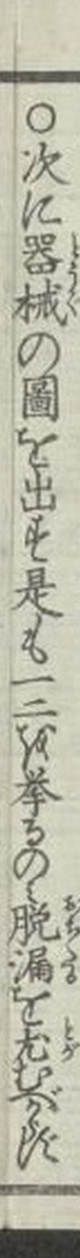○次に器械の図を出す是も一二を挙るのみ脱漏を尤むべからず

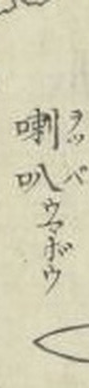喇叭ウマボウ

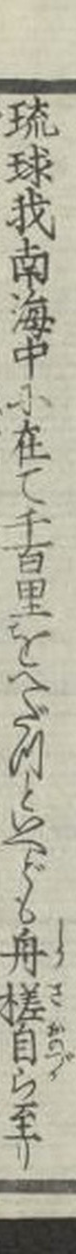琉球我南海中に在て千百里をへだつといへども舟槎自ら至り
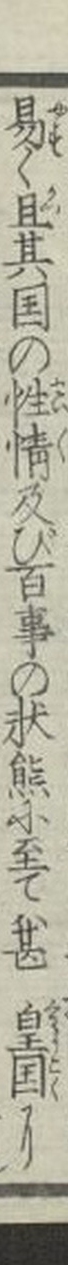易く且其国の性情及び百事の状態に至て甚皇国に
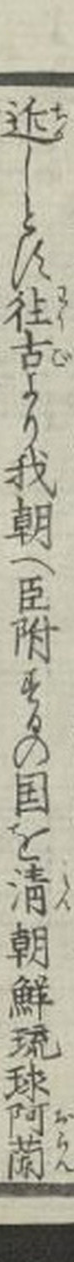近しとす往古より我朝へ臣附するの国を清朝鮮琉球阿蘭
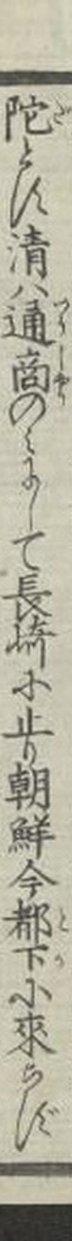陀とす清は通商のみにして長崎に止り朝鮮今都下に来らず
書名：中山国使略
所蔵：University of the Ryukyus Library
